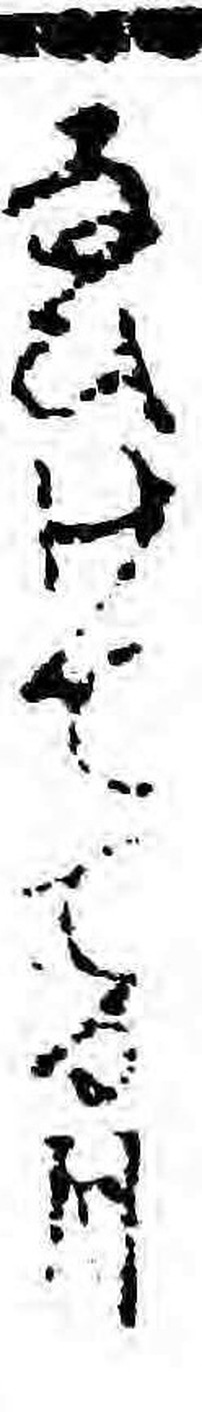なひけててる月
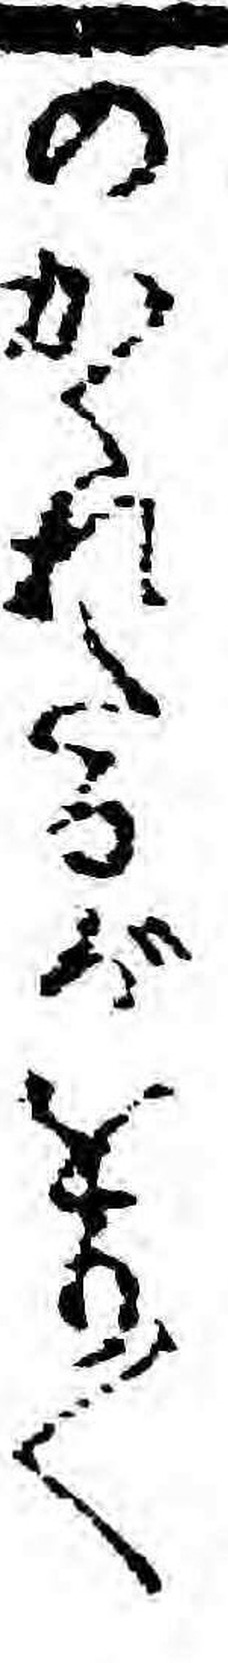のかくれたるがをり〳〵
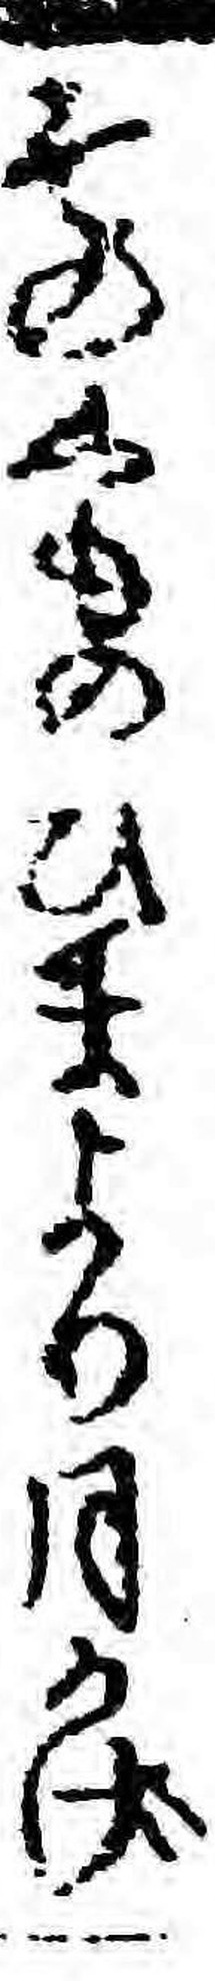そのくものひまより月かげ
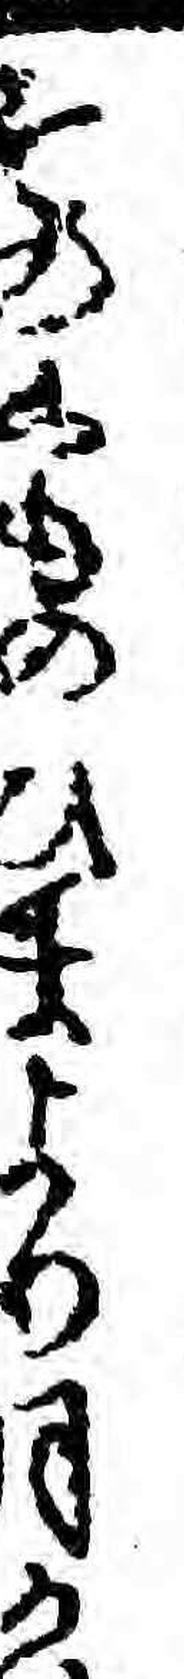そのくものひまより月かげ
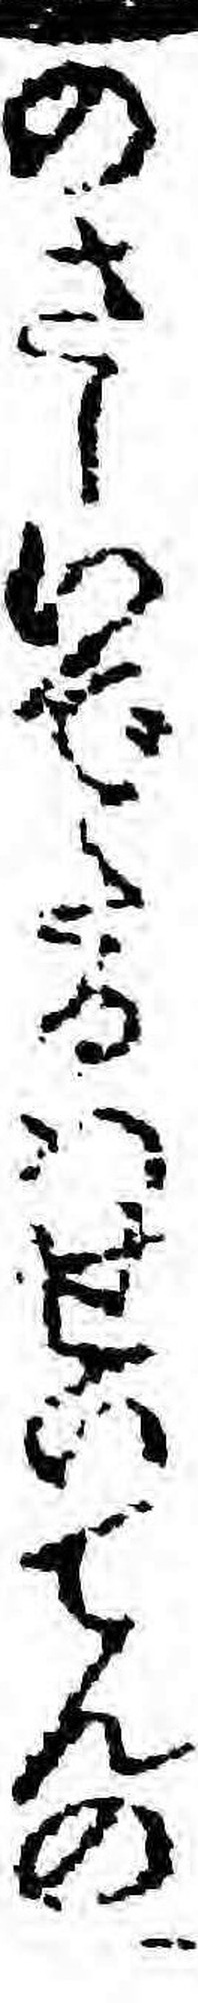のさしいでたるはせいてんの
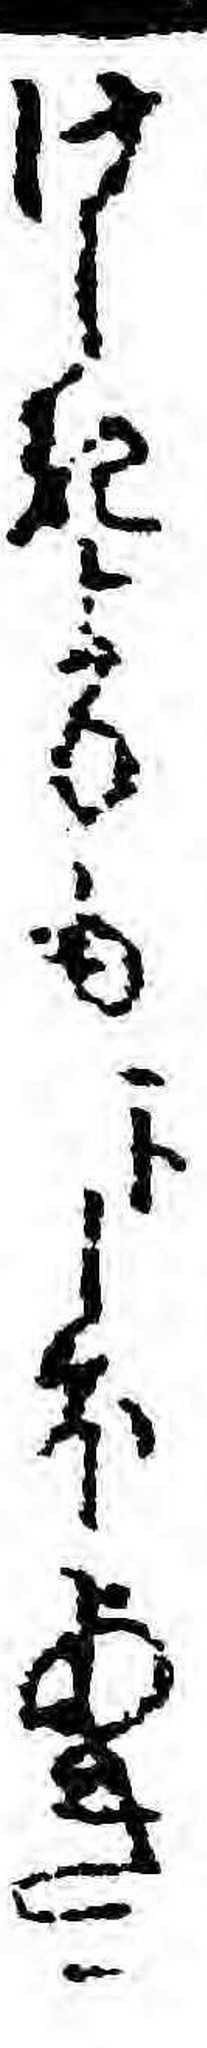けしきよりも一としほあき
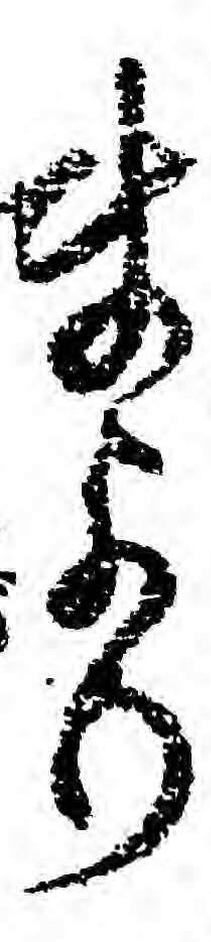まより
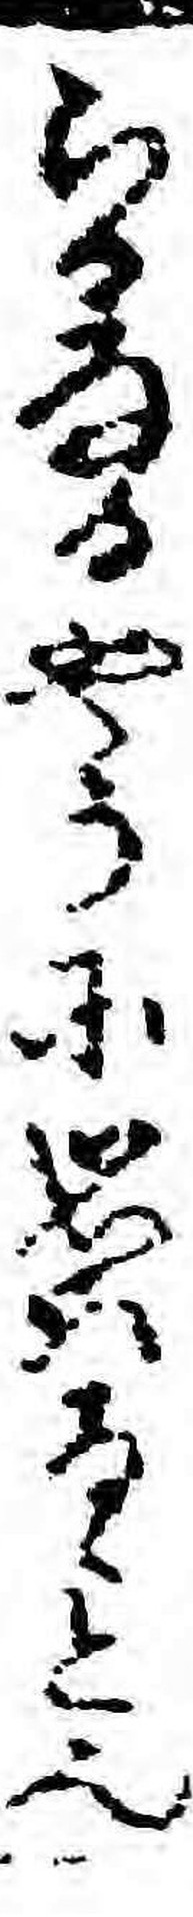らかなるやうに思はるゝと也
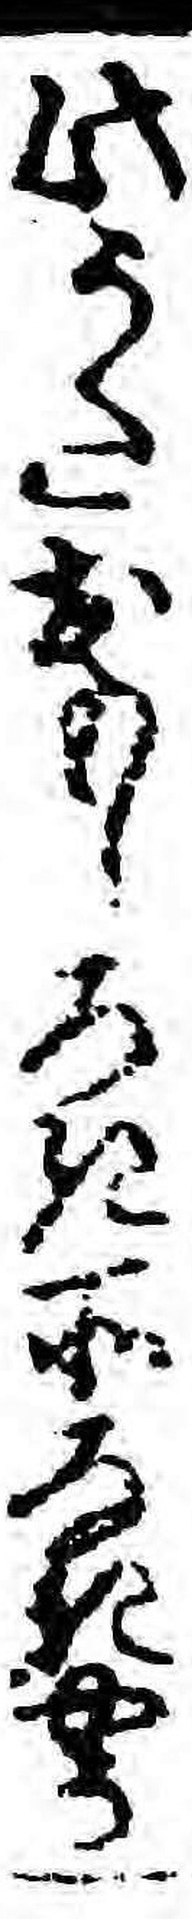此うたおもしろき所なきやう
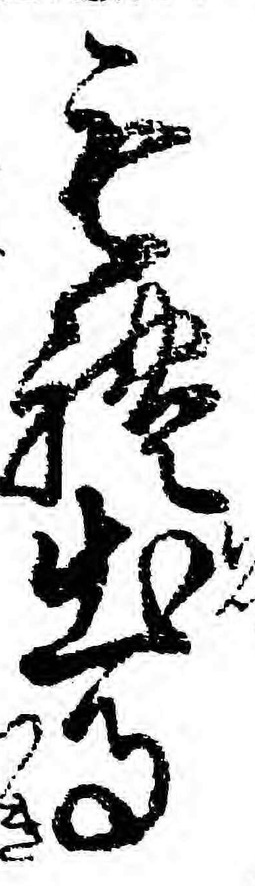もれ出る
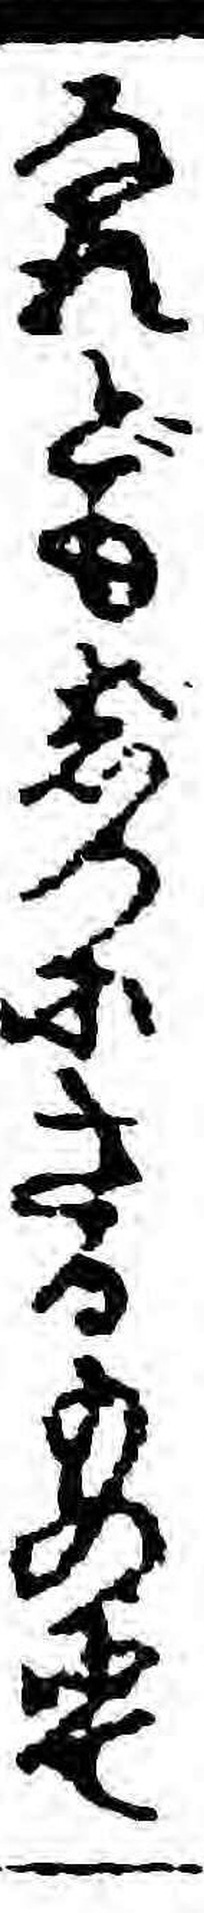なれどもじつにさるものにて
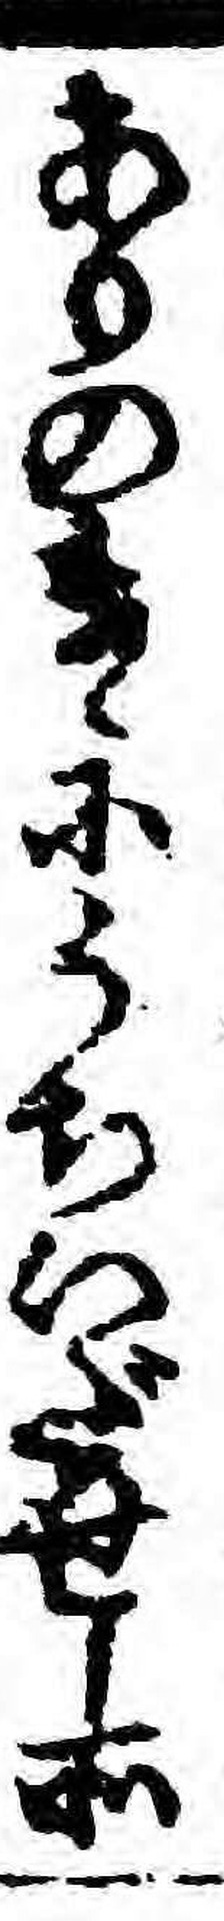ありのまゝにうちいだせし所
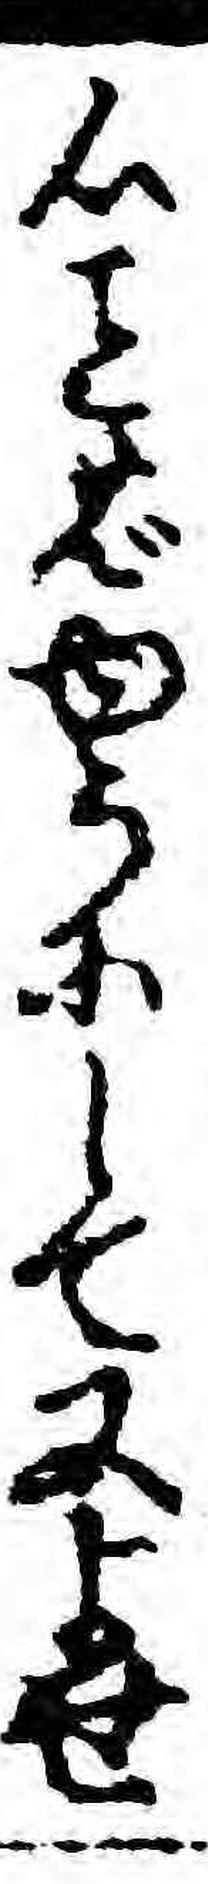心ことばゆうにして又よせ
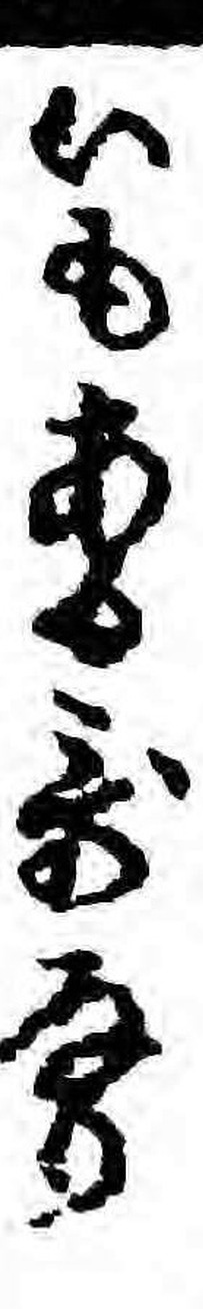いもある哥なり

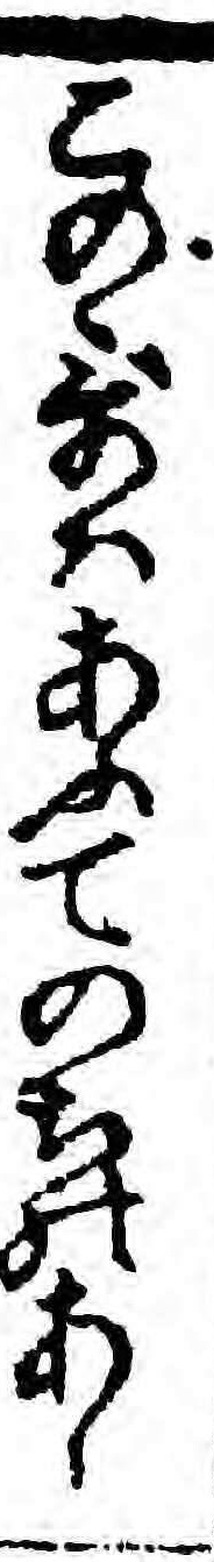この哥はあふてのちのあし
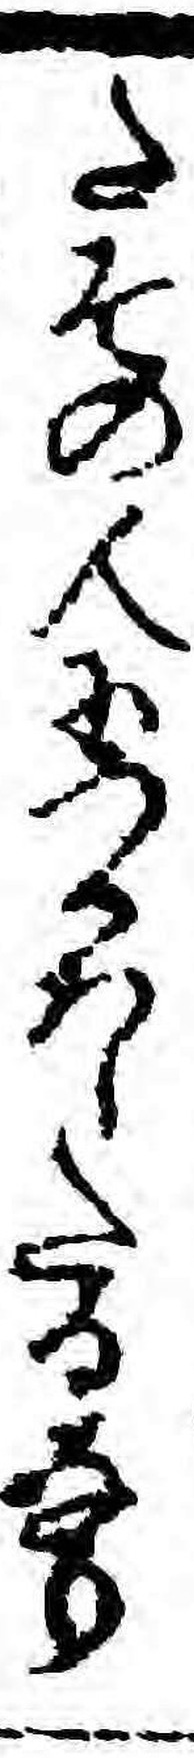たその人につかはしたるなり
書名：頭書和歌注譯／壽賀多百人一首小倉錦
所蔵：国文学研究資料館
